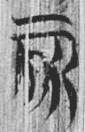所
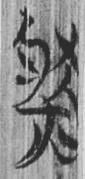然
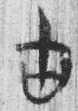古（故）
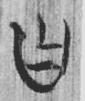曰
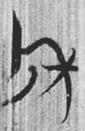禾
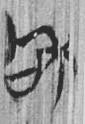和
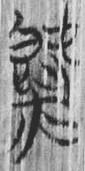○（氣）
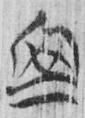室
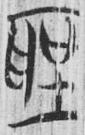聖（聲）
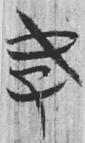好
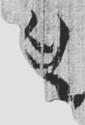色
